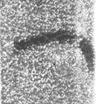一
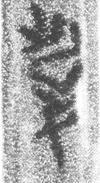○（文）
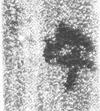竹
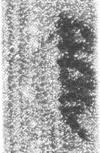○（翣）
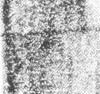一
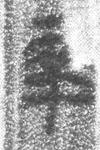兩
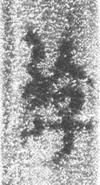○（鞔）
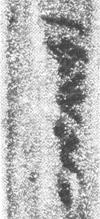○（屨）
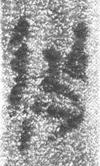紫
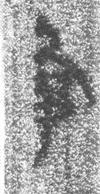韋
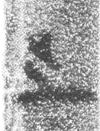之
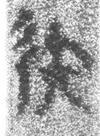納
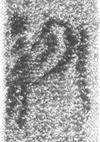紛
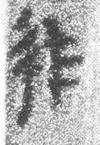純
